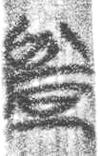監
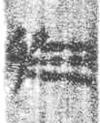於
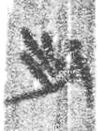此
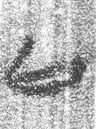㠯（以）
